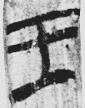王
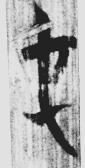才（在）
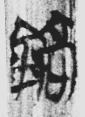鎬
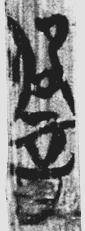○（召）
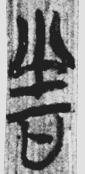周
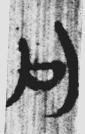公
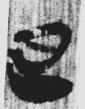旦
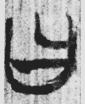曰
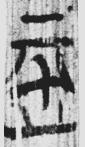亞（嗚）
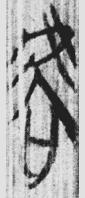○（呼）
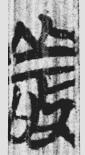敬
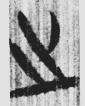之
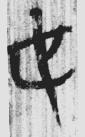才（哉）
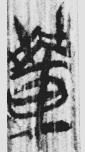○（朕）
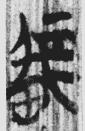○（聞）
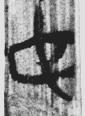才（哉）
